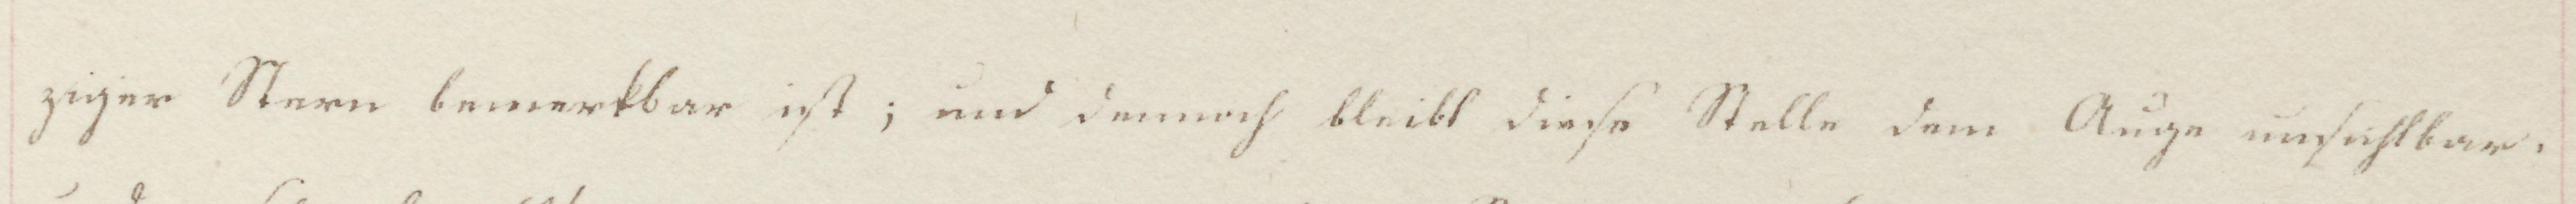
ziger Stern bemerkbar ist; und dennoch bleibt diese Stelle dem Auge unsichtbar,
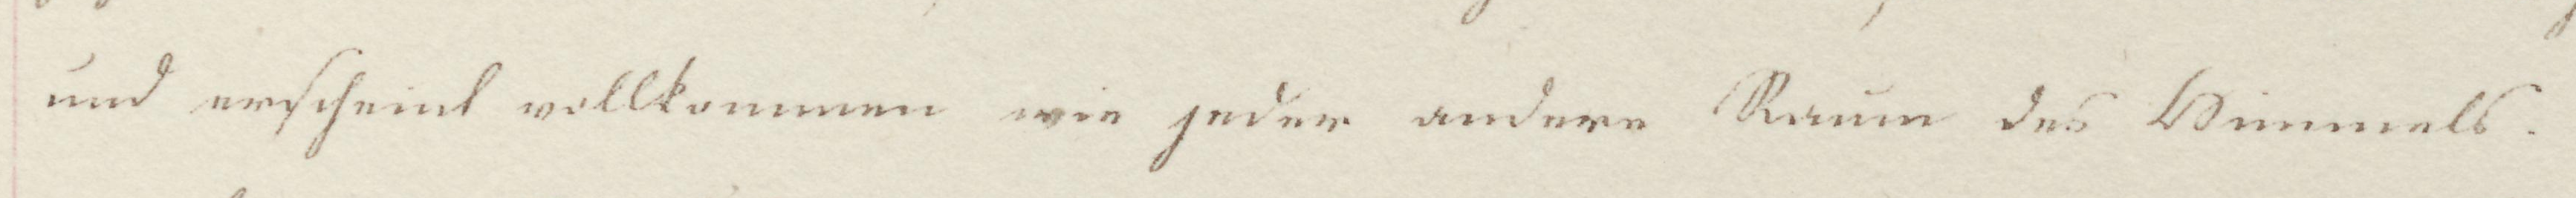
und erscheint vollkommen wie jeder andere Raum des Himmels.
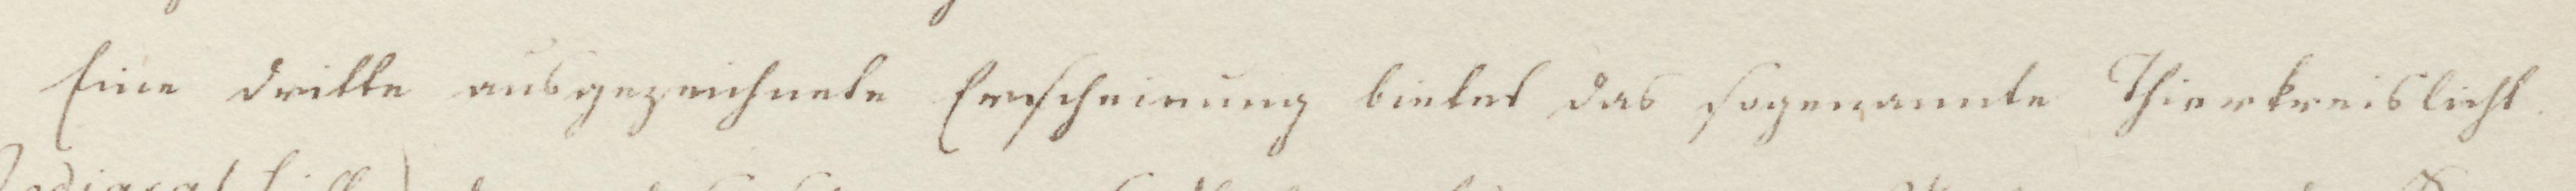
Eine dritte ausgezeichnete Erscheinung bietet das sogenannte Thierkreislicht
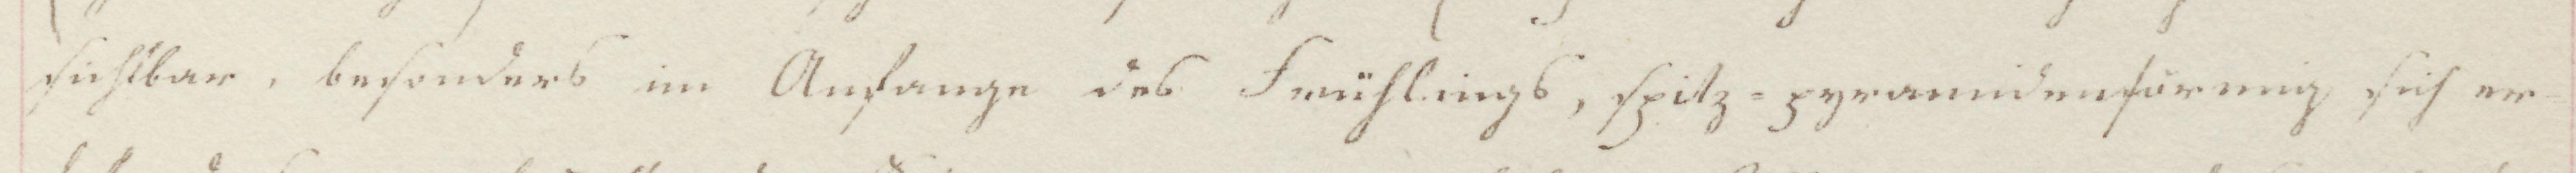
sichtbar, besonders im Anfange des Frühlings, spitz-pyramidenförmig sich er-
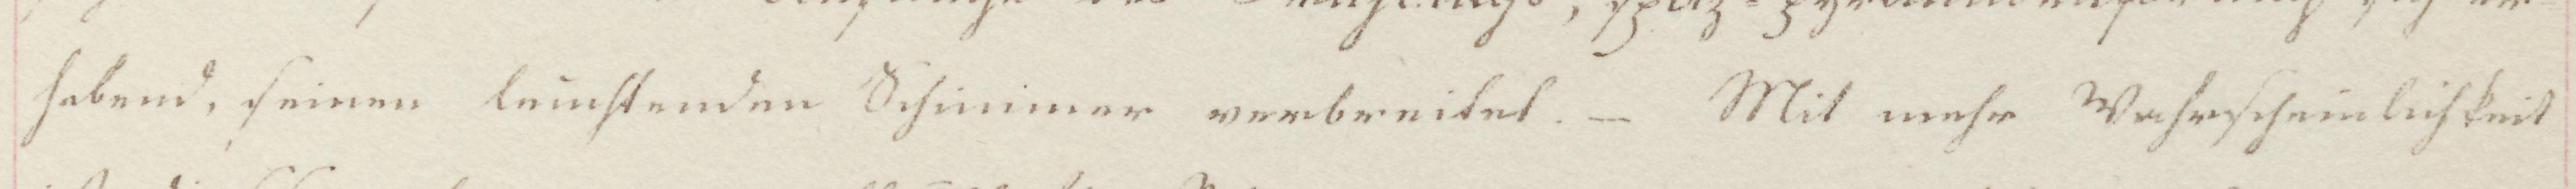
hebend, seinen leuchtenden Schimmer verbreitet. – Mit mehr Wahrscheinlichkeit
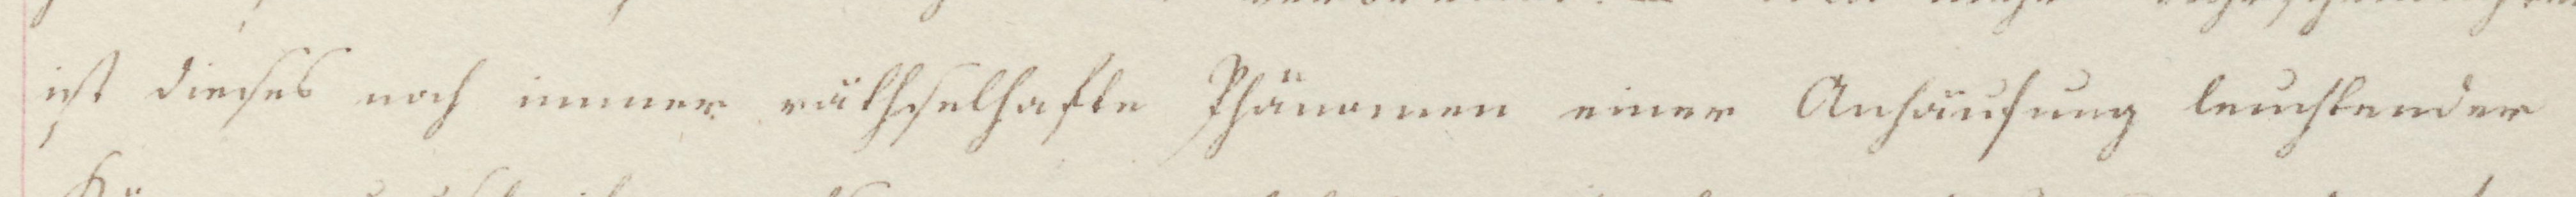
ist dieses noch immer räthselhafte Phänomen einer Anhäufung leuchtender
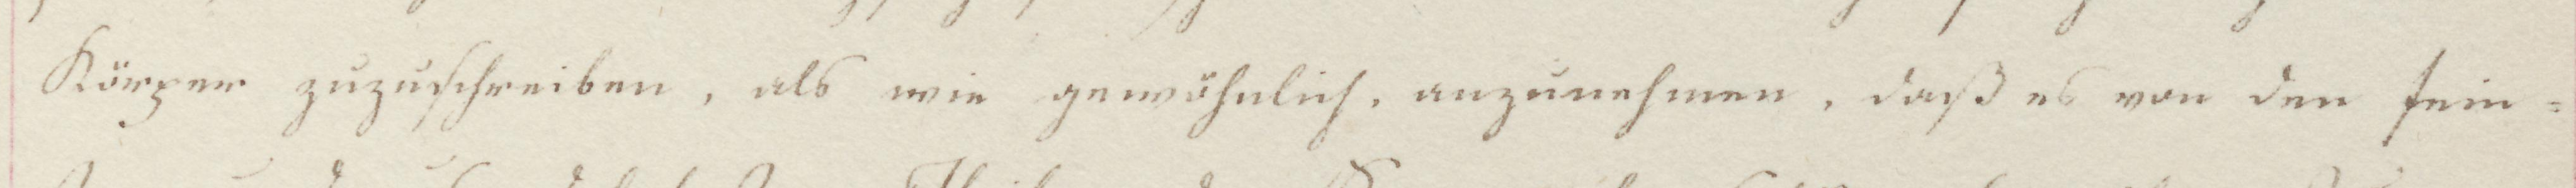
Körper zuzuschreiben, als wie gewöhnlich, anzunehmen, daß es von den fein-
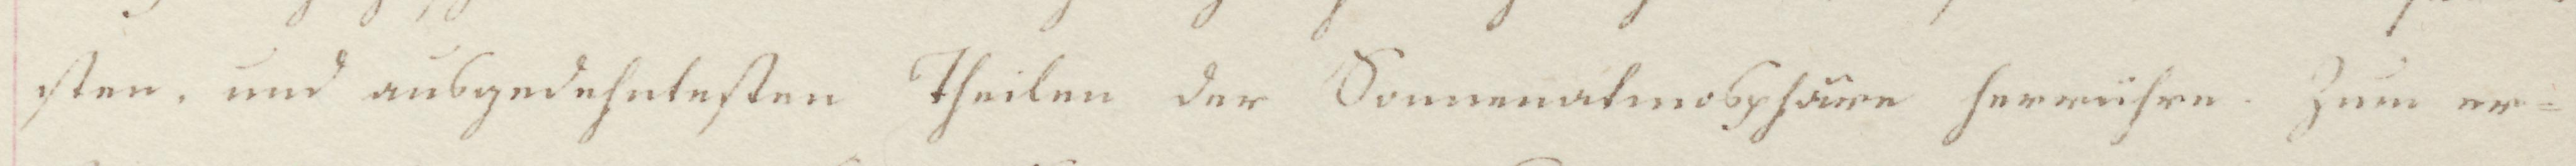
sten, und ausgedehntesten Theilen der Sonnenatmosphäre herrühre. Zum er-
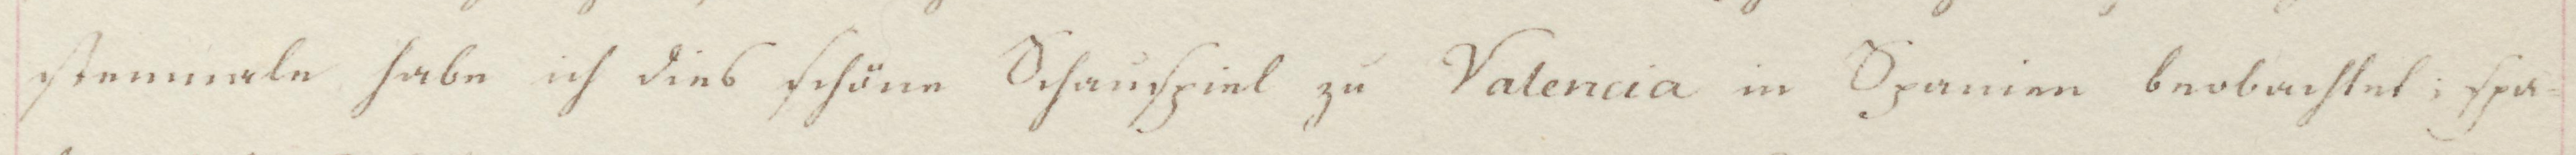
stenmale habe ich dies schöne Schauspiel zu Valencia in Spanien beobachtet; spä-
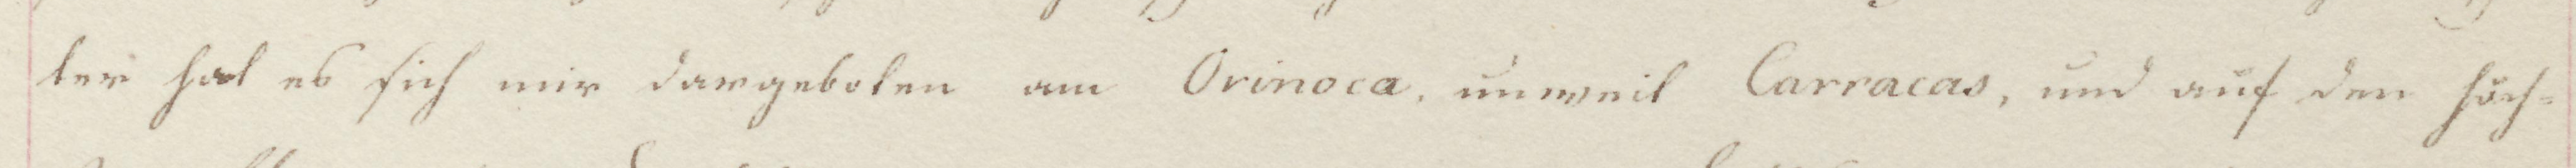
ter hat es sich mir dargeboten am Orinocao, unweit Carracas, und auf der höch-
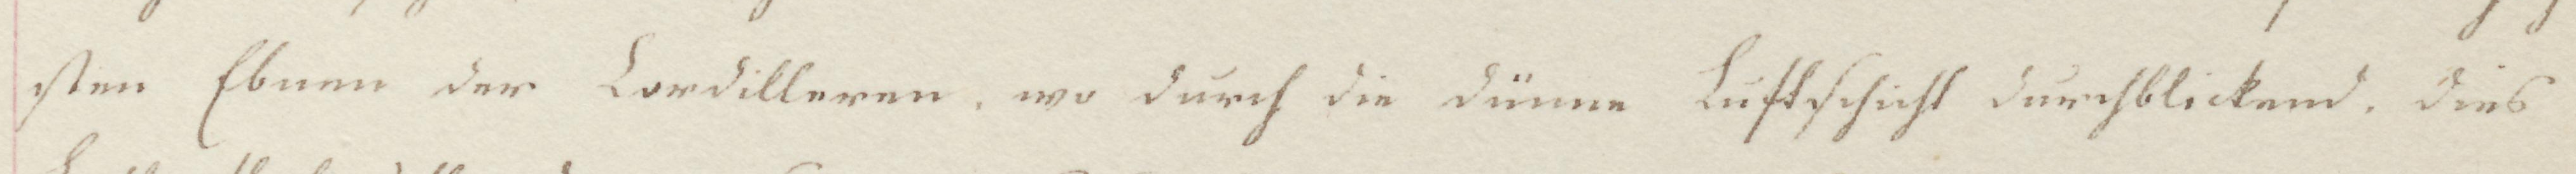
sten Ebene der Cordilleren, wo durch die dünne Luftschicht durchblickend, dies
